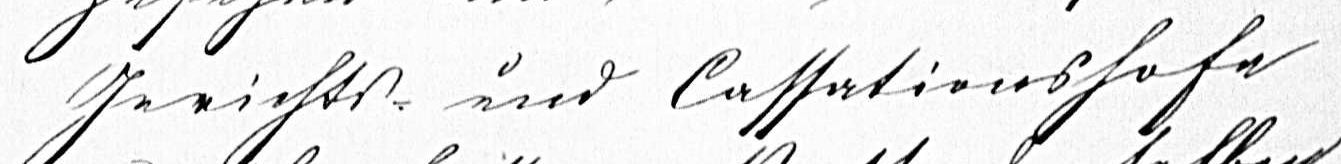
Gerichts- und Cassationshofe
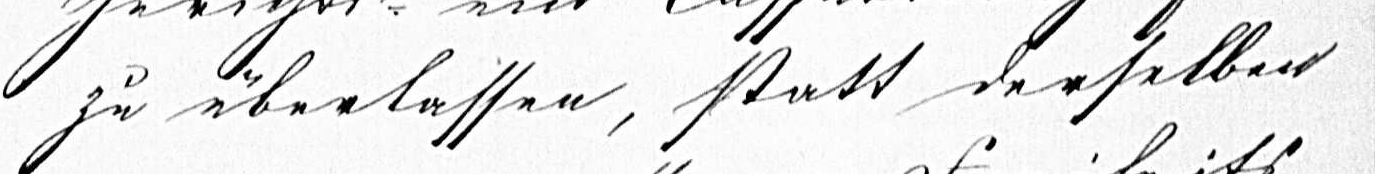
zu überlassen, statt derselben
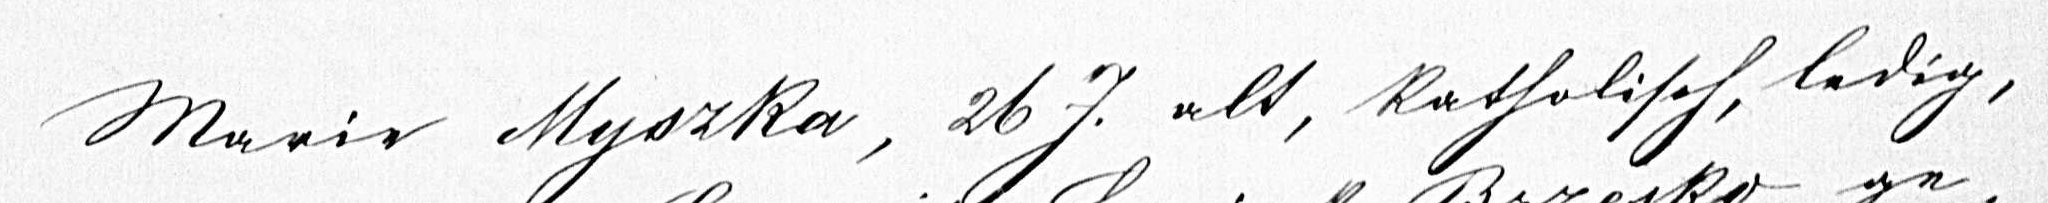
Marie Myszka, 26 J. alt, katholisch, ledig,
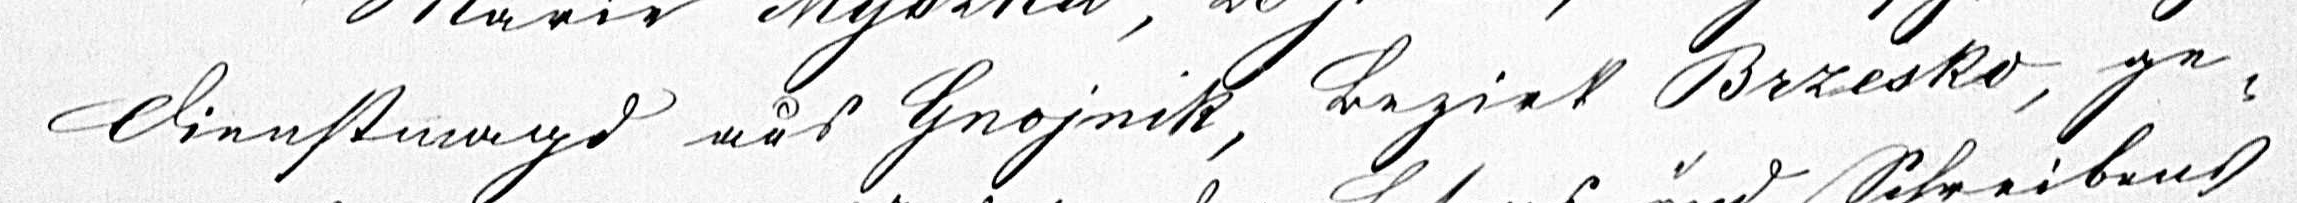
Dienstmagd aus Gnojnik, Bezirk Brzesko, ge¬
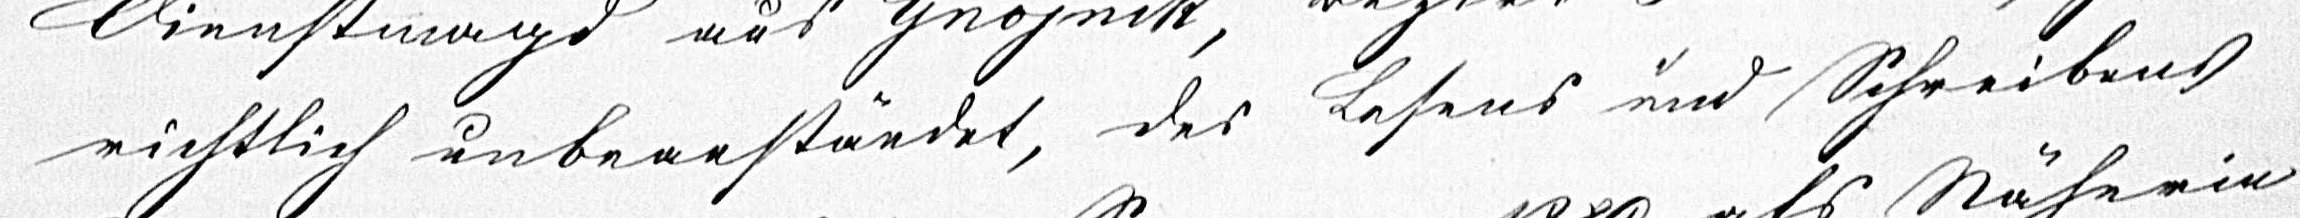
richtlich unbeanständet, des Lesens und Schreibens
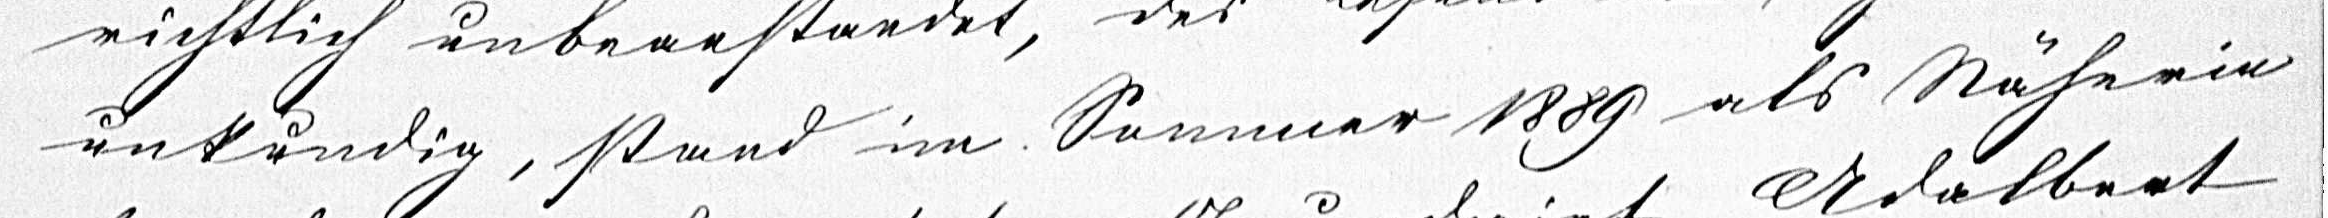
unkundig, stand im Sommer 1889 als Näherin
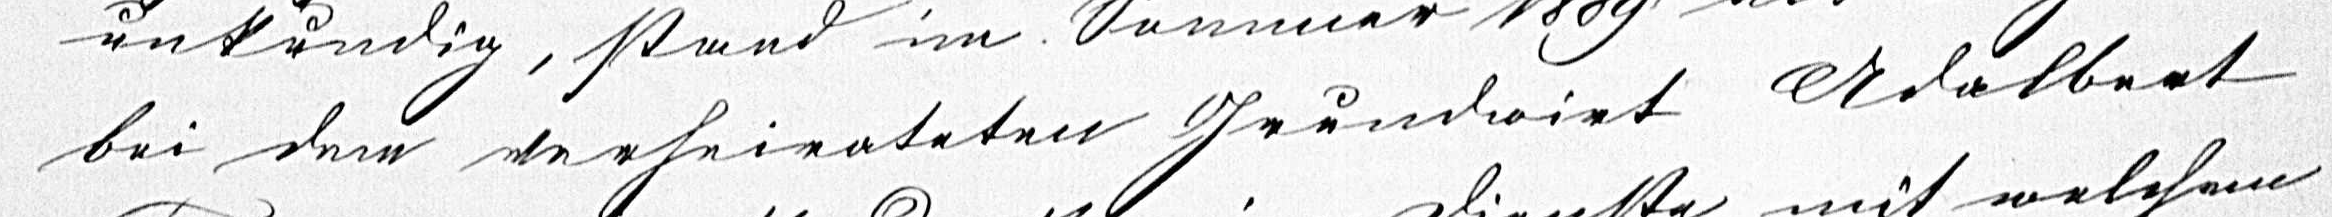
bei dem verheirateten Grundwirt Adalbert
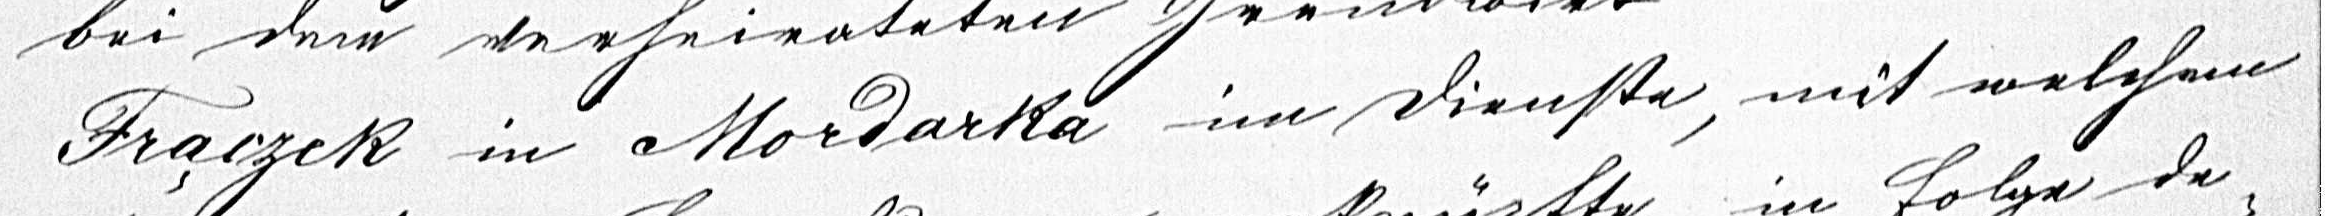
Frączek in Mordarka im Dienste, mit welchem
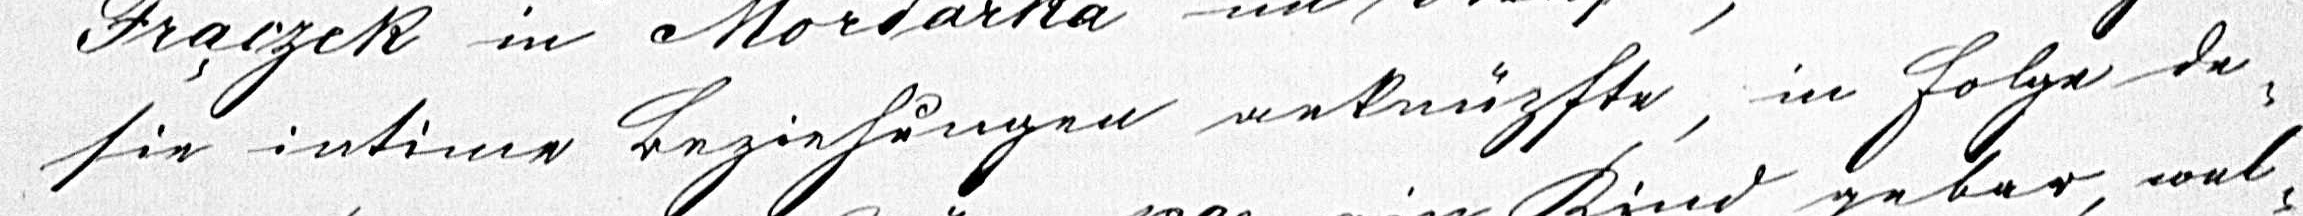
sie intime Beziehungen anknüpfte, in Folge de¬
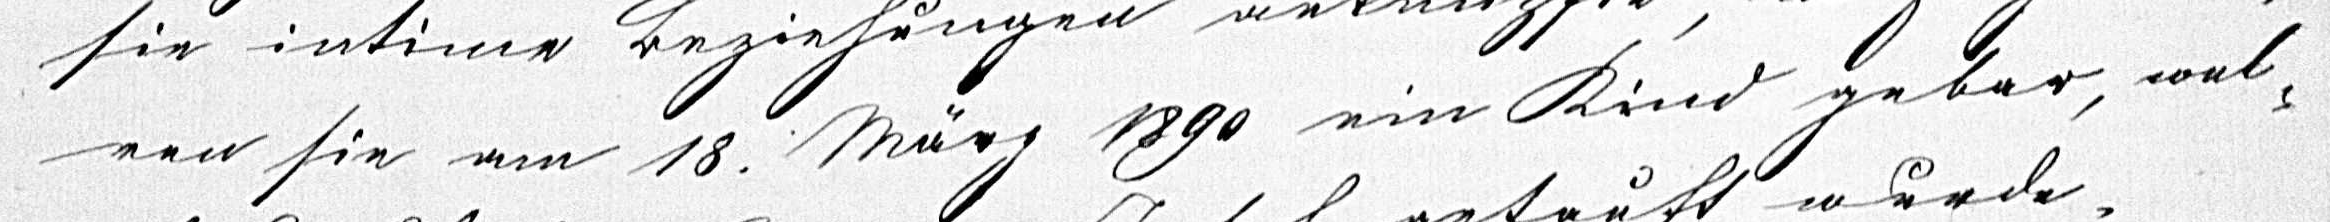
ren sie am 18. März 1890 ein Kind gebar, wel¬
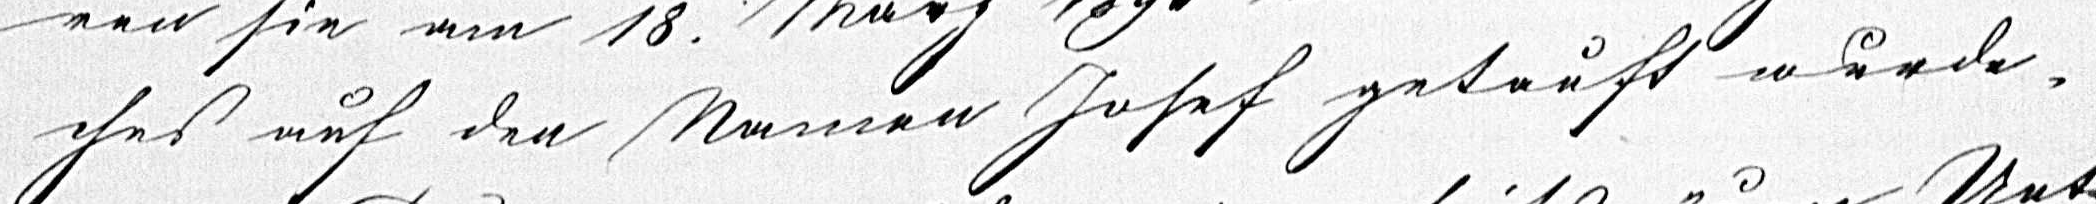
ches auf den Namen Josef getauft wurde.
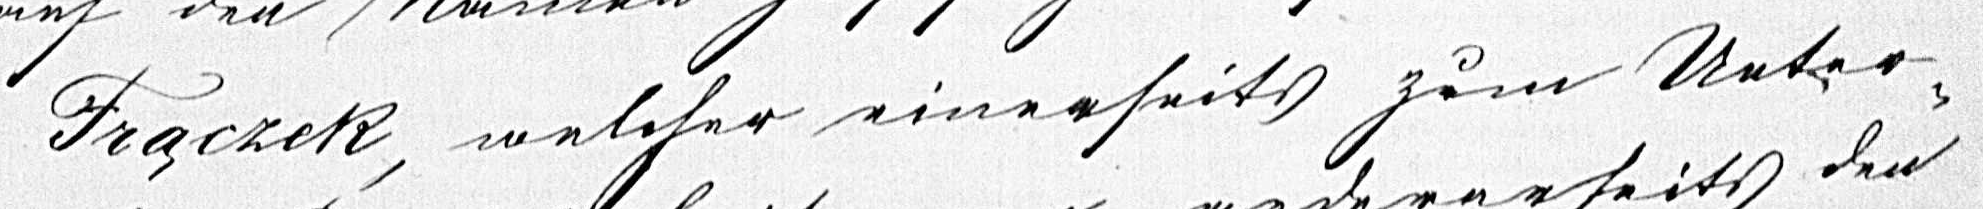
Frączek, welcher einerseits zum Unter¬
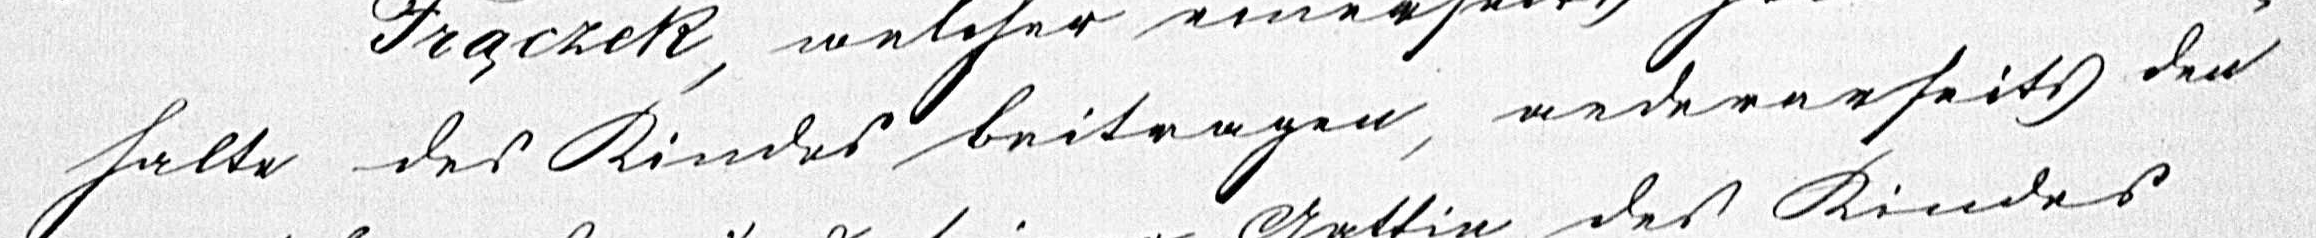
halte des Kindes beitragen, andererseits den
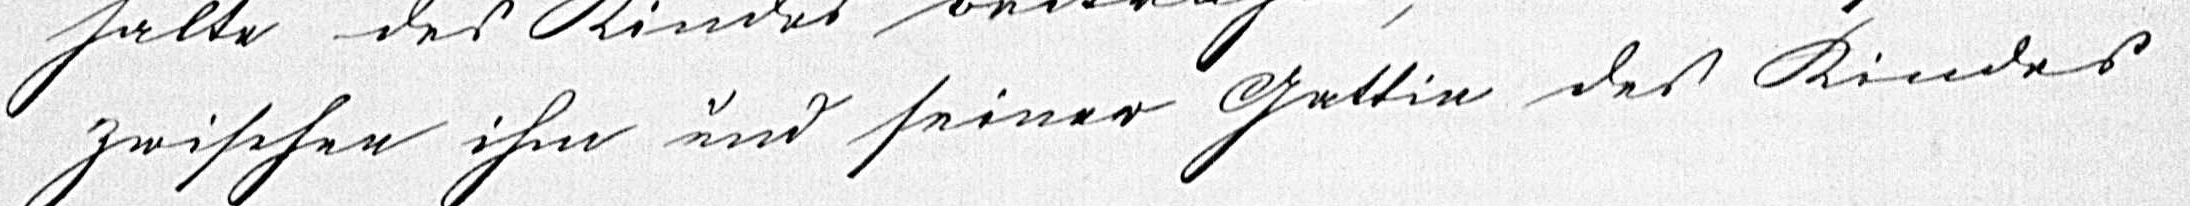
zwischen ihm und seiner Gattin des Kindes
